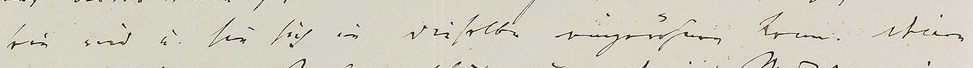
sein wird u. sie sich in dieselbe eingewöhnen kann. Deine
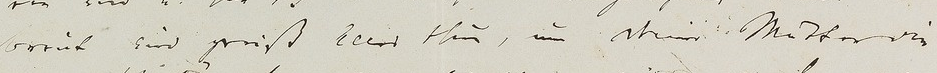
Braut wird gewiß Alles thun, um deiner Mutter die
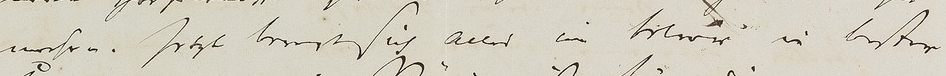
machen. Jetzt bewegt sich alles im Belvoir in bester
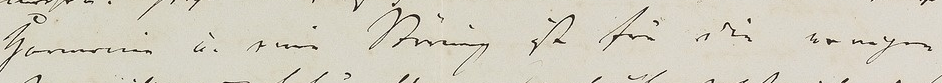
Harmonie u. eine Störung ist für die wenigen
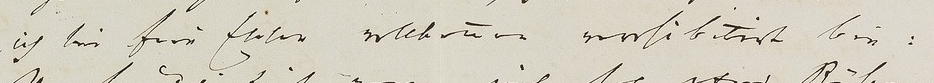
ich bei Frau Escher vollkommen rerehibitirt bin:
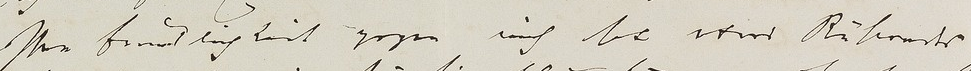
Ihre Freundlichkeit gegen mich hat etwas Rührendes
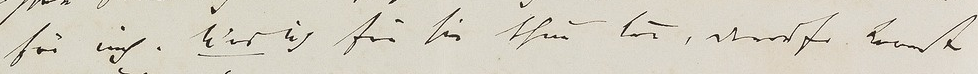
für mich. Was ich für sie thun kann, darauf kannst
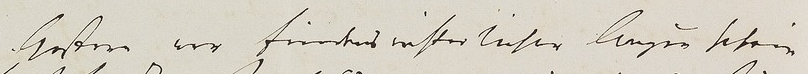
Gestern war friedensrichterlicher Augenschein
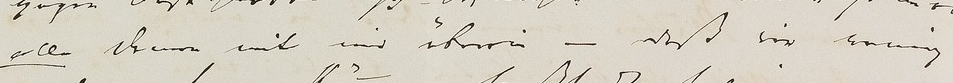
alle Damen mit mir überein – daß wir wenig
